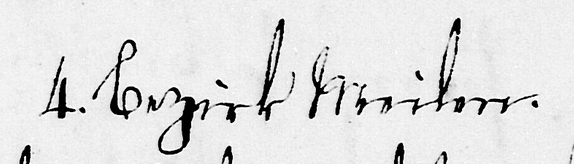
4. Bezirk Meilen.
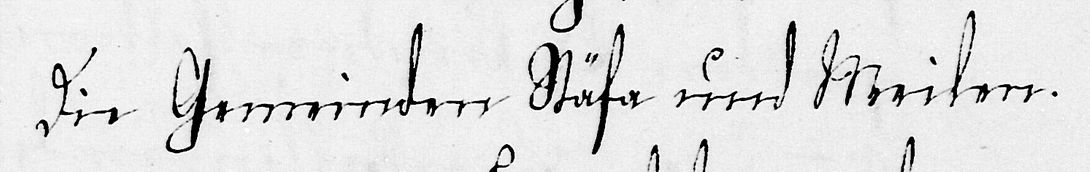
Die Gemeinden Stäfa und Meilen.
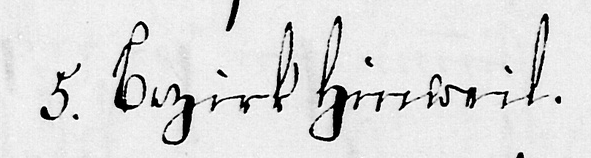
5. Bezirk Hinweil.
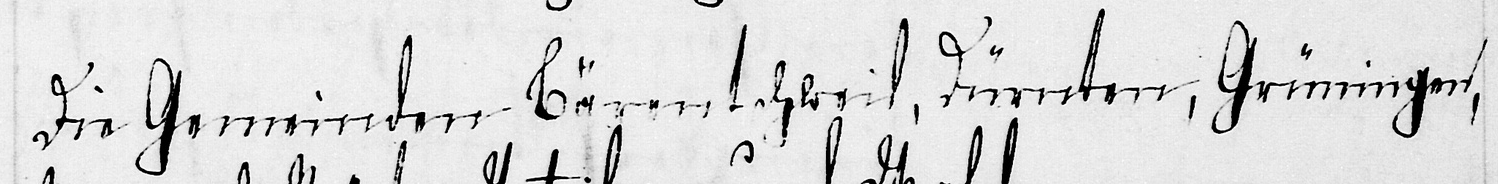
Die Gemeinden Bärentschweil, Dürnten, Grüningen,
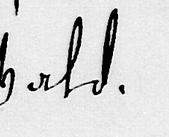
ald.
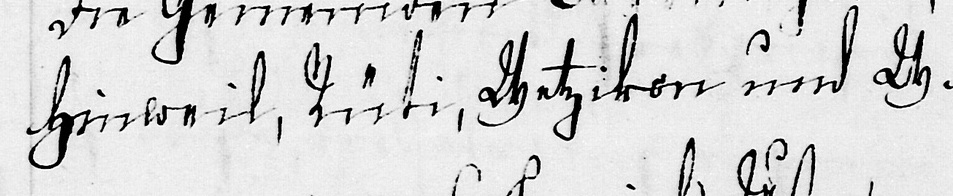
Hinweil, Rüti, Wetzikon und W¬
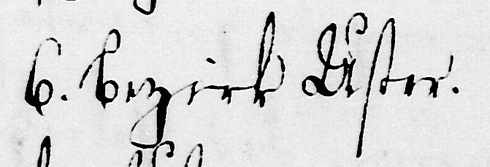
6. Bezirk Uster.
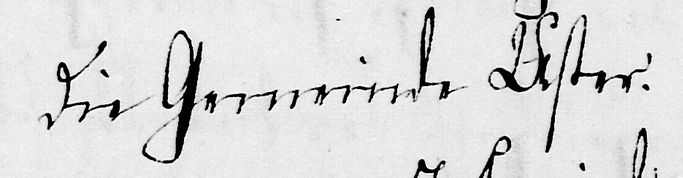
Die Gemeinde Uster.
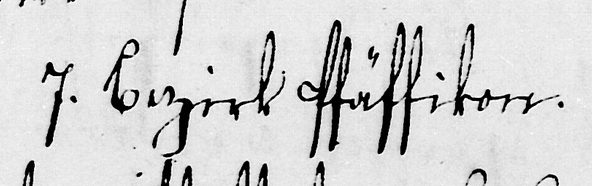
7. Bezirk Pfäffikon.
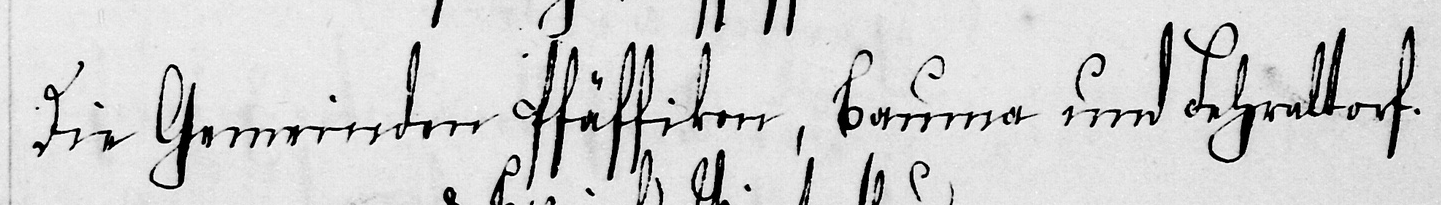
Die Gemeinden Pfäffikon, Bauma und Fehraltorf.
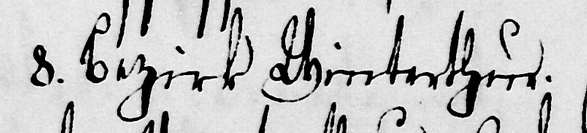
8. Bezirk Winterthur.
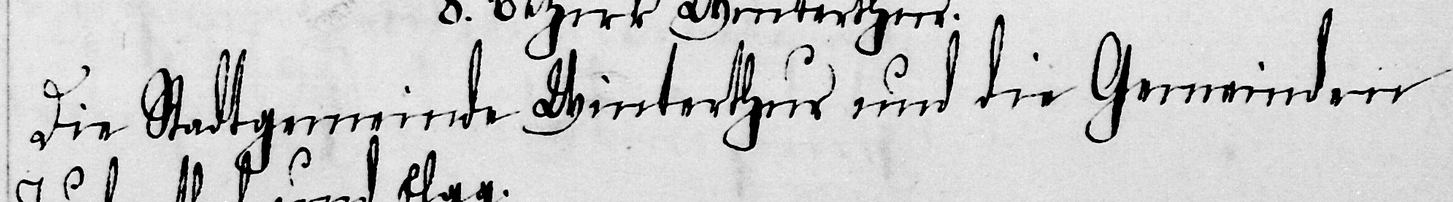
Die Stadtgemeinde Winterthur und die Gemeinden
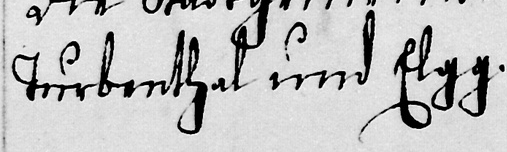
Turbenthal und Elgg.
